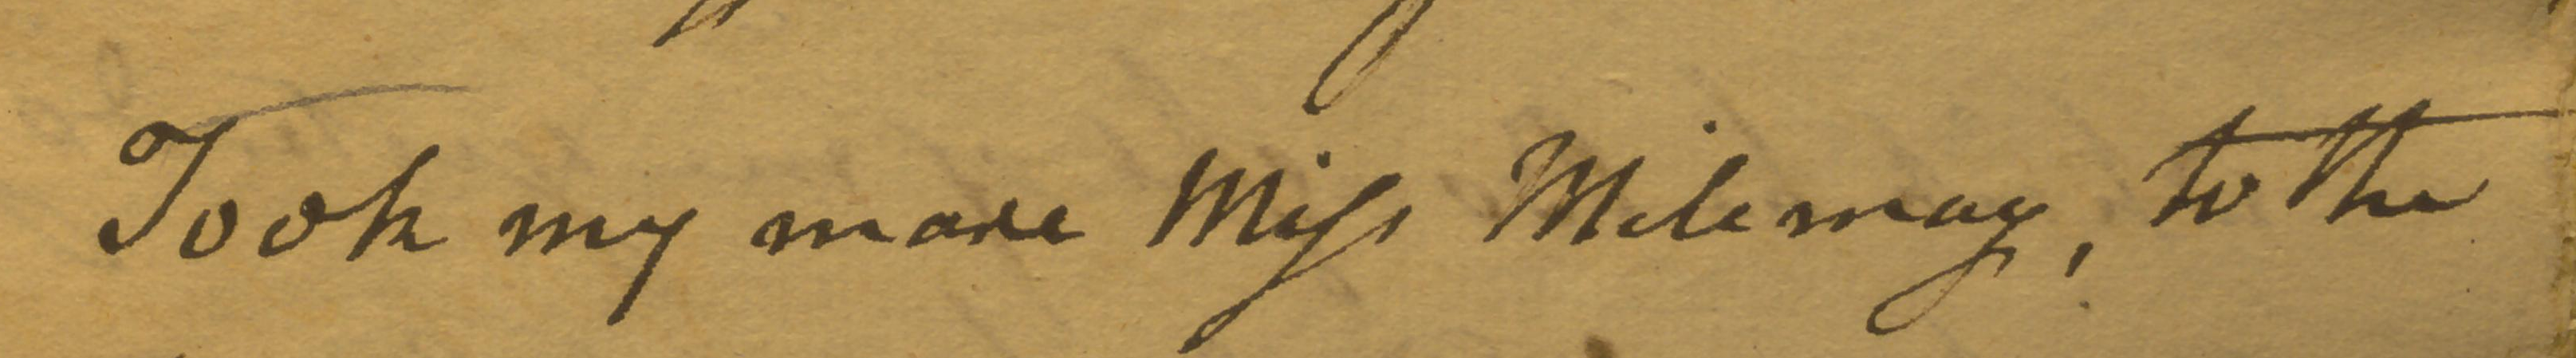Took my mare Miss Milemay to the
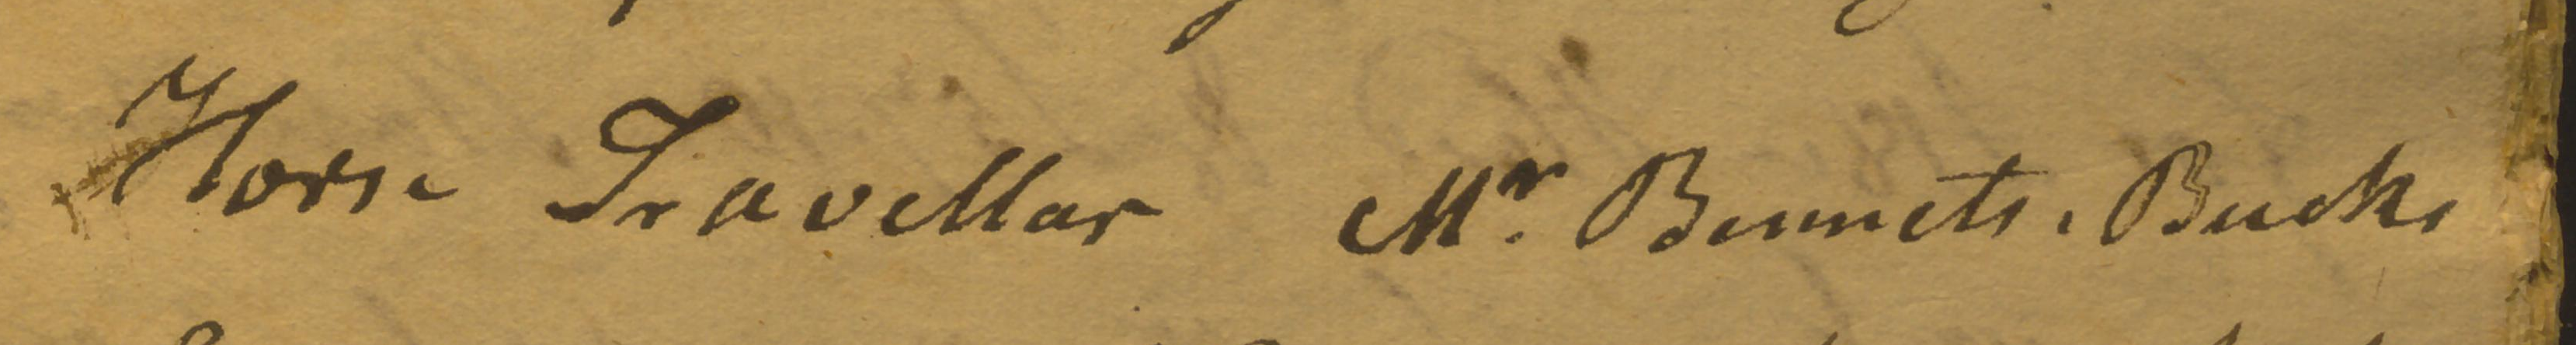Horse Travellar M^r. Bennets, Bucks
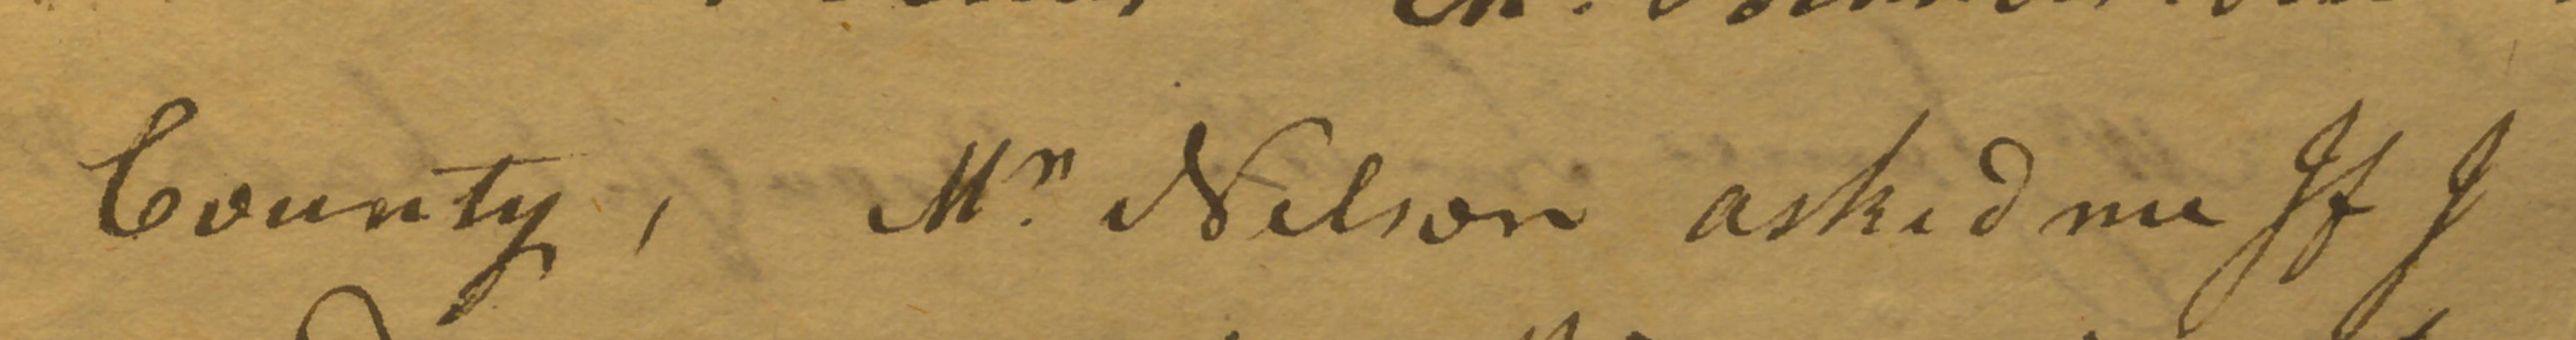County, M^r. Nelson asked me If I
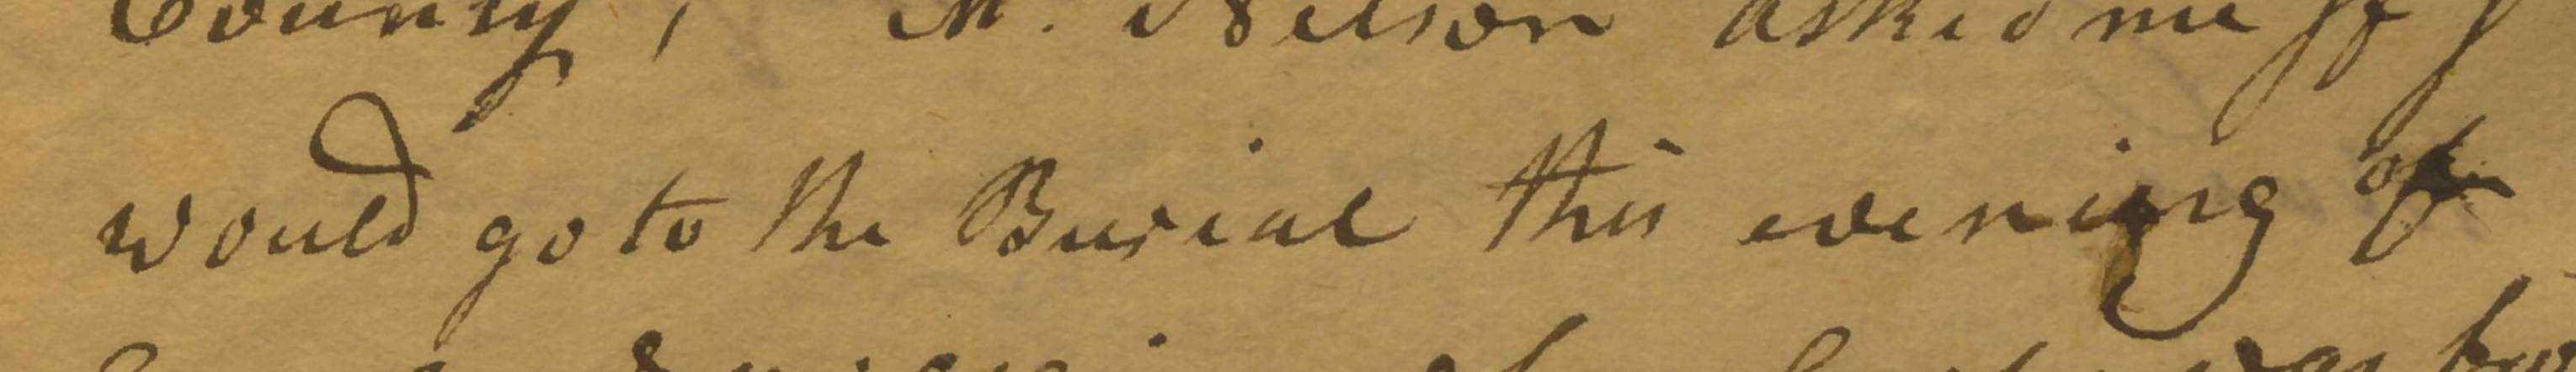would go to the Burial this evening of
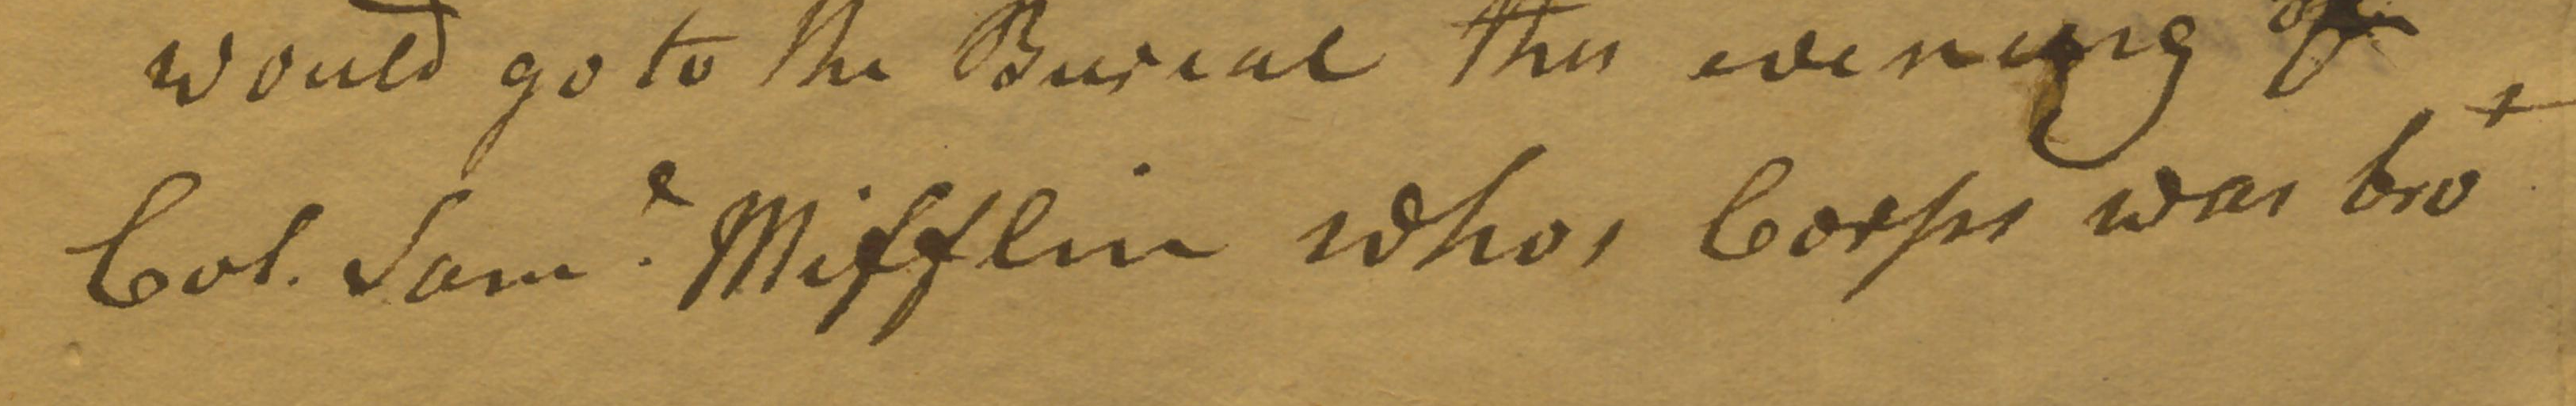Col. Sam^l. Mifflin whos Corps was bro^t
